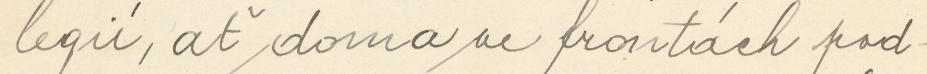legií, ať doma ve frontách pod-
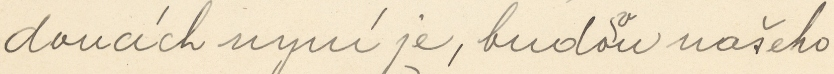doucích nyní je, budovu našeho
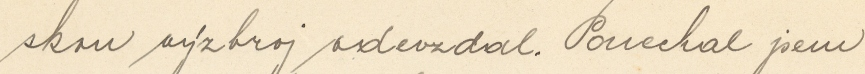skou výzbroj odevzdal. Ponechal jsem
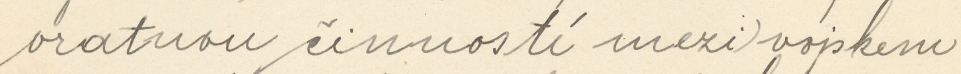vratnou činností mezi vojskem
